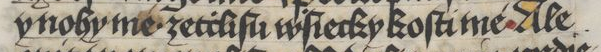y nohy mé.zetċliſu wẛiecky koſti mé.Ale
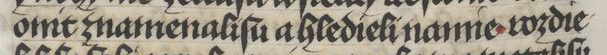onít znamenaliſu a hledieli namie.rozdie¬
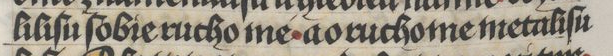liliſu ſobie rucho mé.a o rucho me metaliſu
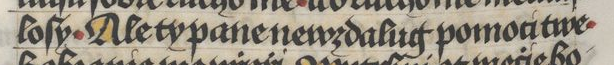loſy.Ale ty pane newzdalug pomoci twe.
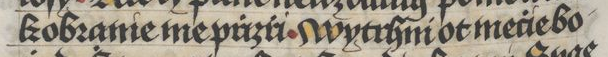kobranie me pṙizṙi.Wytrhni ot meċie bo¬
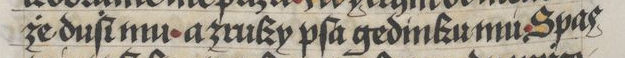że duẛi m.a zruka pſa gedinku mú.Spas
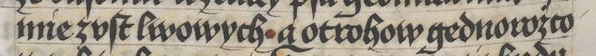mie zuſt lwowych.a otrohow gednorożco¬
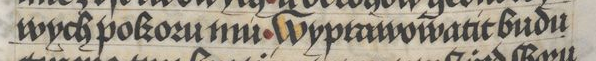wych pokoru mú.Wyprawowatit budu
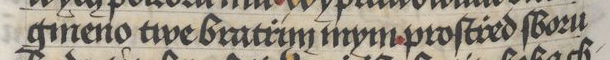gmeno twe bratṙím proſtṙed boru
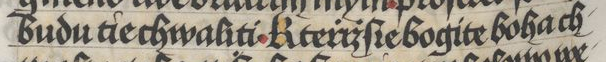budu tie chwaliti.Kteṙiżſie bogite boha ch¬
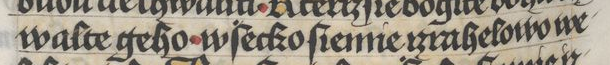walte geho.wẛecko ſiemie izrahelowo we¬
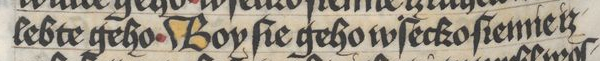lebe geho.Boy ſie geho wẛecko ſiemie iz¬
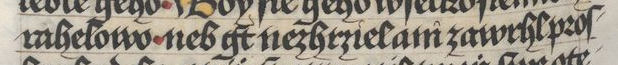rahelowo.neb ḡt nezhrziel ani zawrhl proſ¬
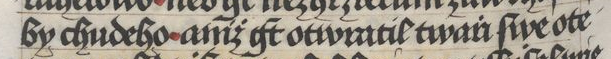by chudeho.aniž ḡt otwratil twaṙi we ote¬
